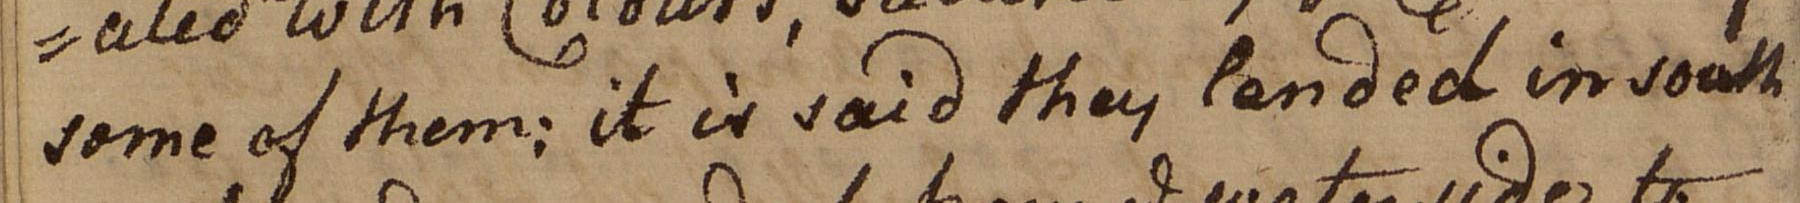some of them; it is said they landed in south
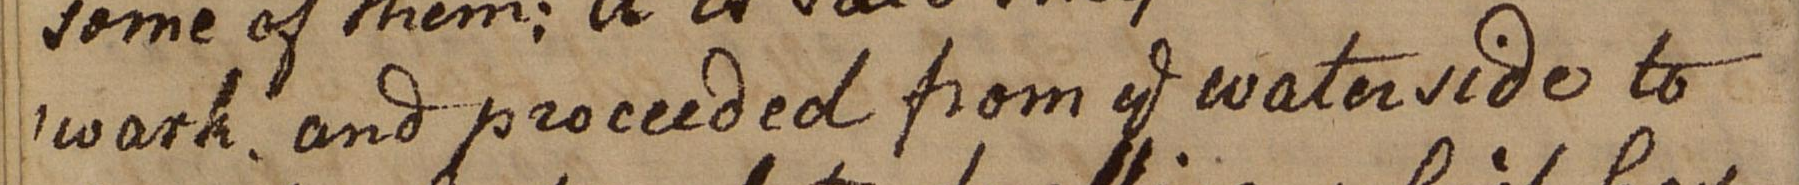wark, and proceeded from y^e waterside to
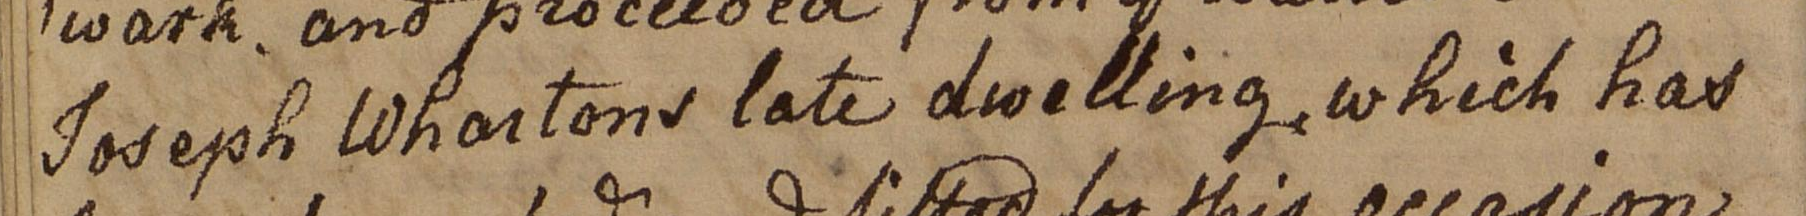Joseph Whartons late dwelling, which has
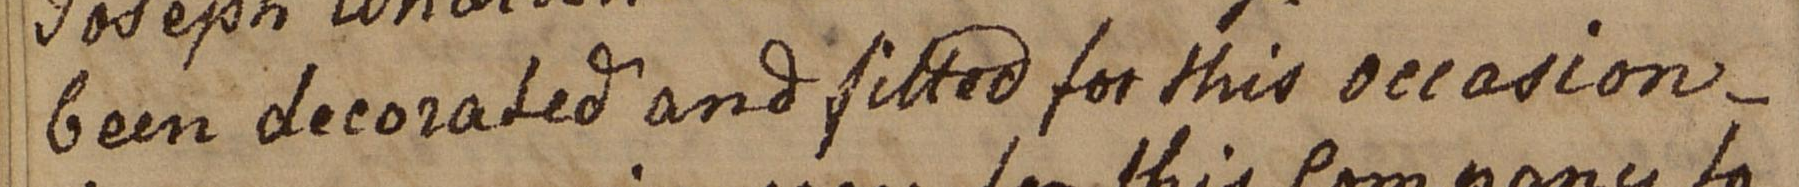been decorated and fitted for this occasion-
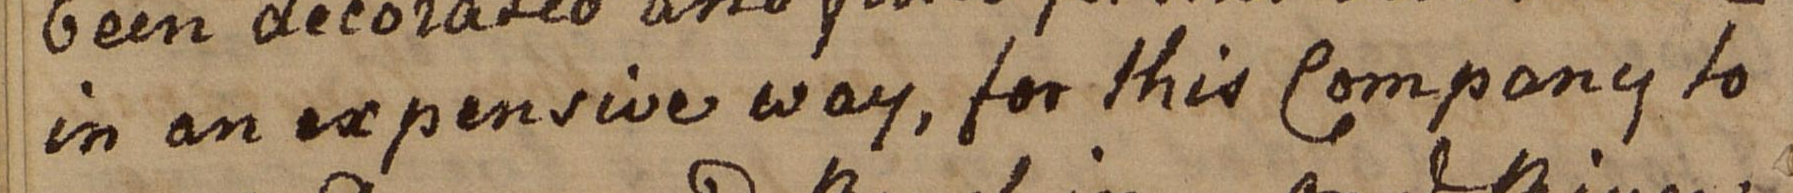in an expensive way, for this Company to
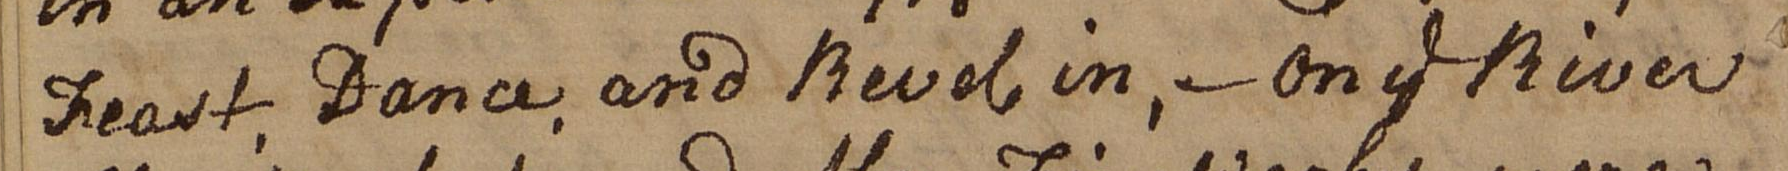Feast, Dance, and Revel in,- On y^e River
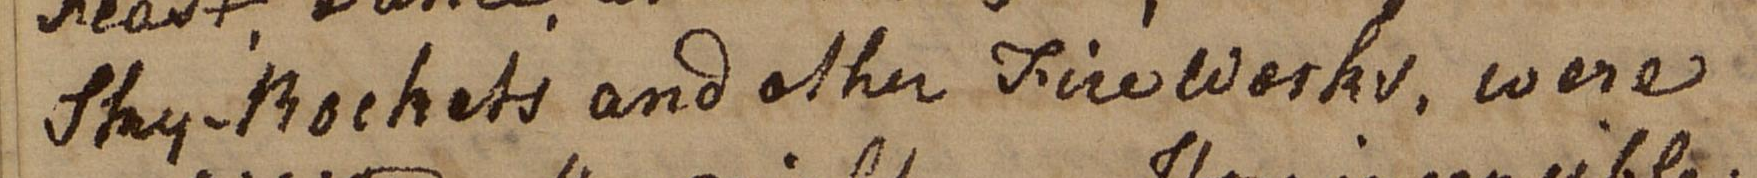Sky-Rockets and other Fire Works, were
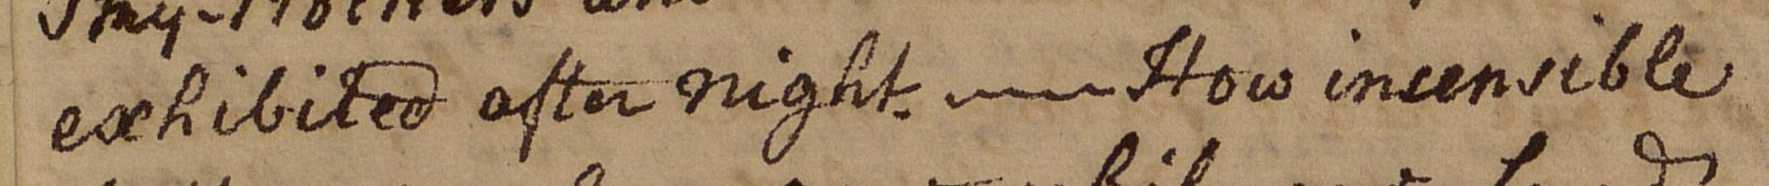exhibited after night- How insensible
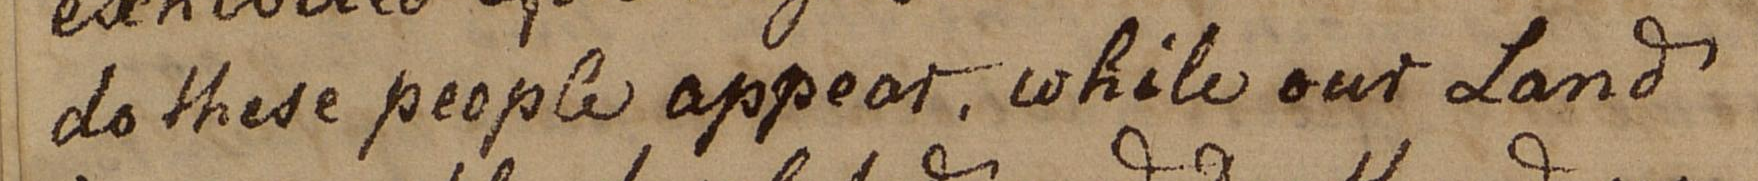do these people appear, while our Land
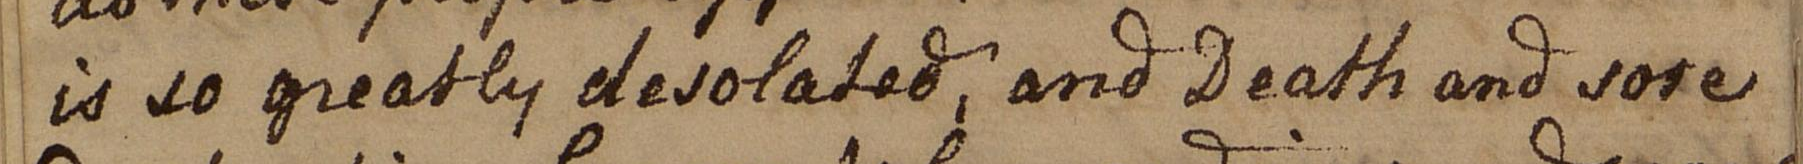is so greatly desolated, and Death and sore
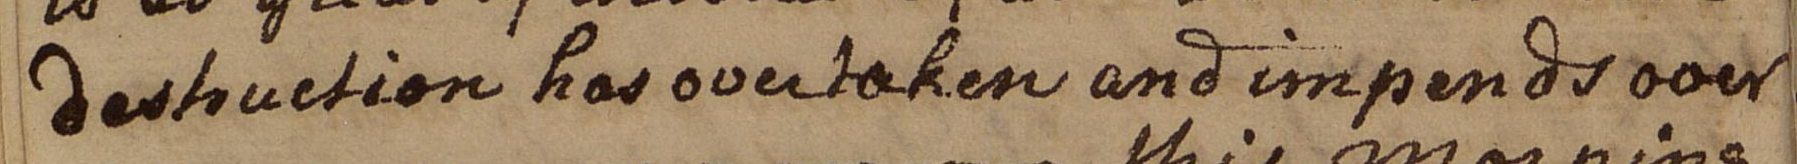destruction has over taken and impends over
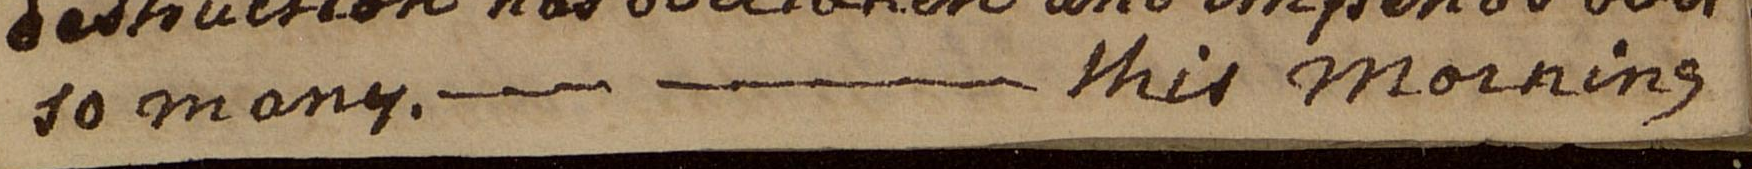so many.-- This morning
